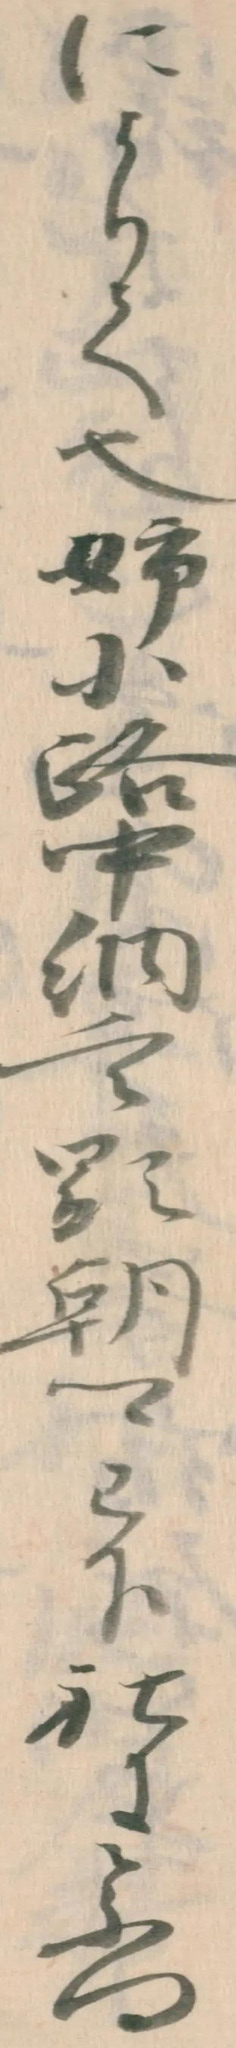によりて也姉小路中納言顕朝卿已下社に参向
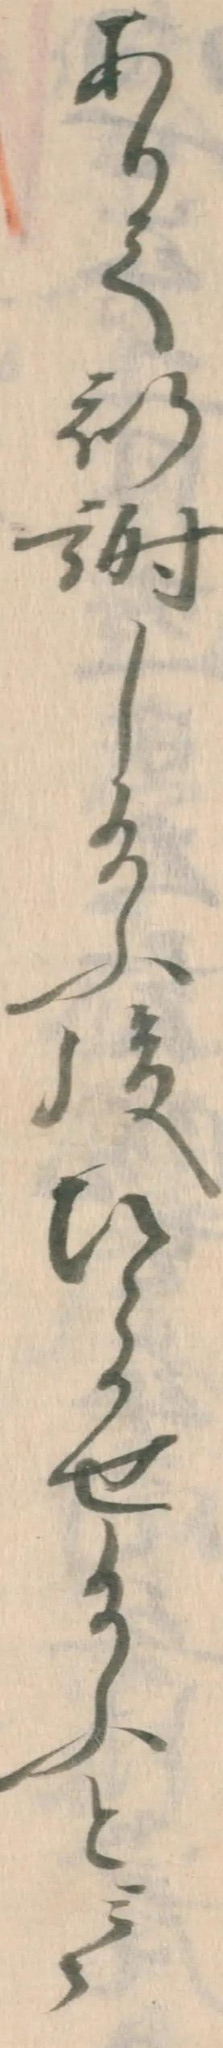ありて祈謝し給ふ後ひらかせ給ふと云々
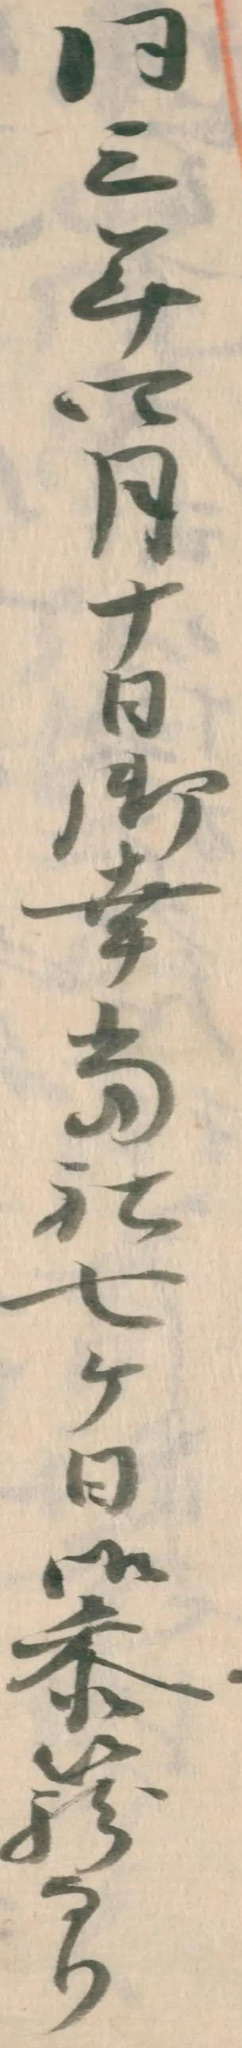同三年四月十日御幸当社七ヶ日御参籠なり
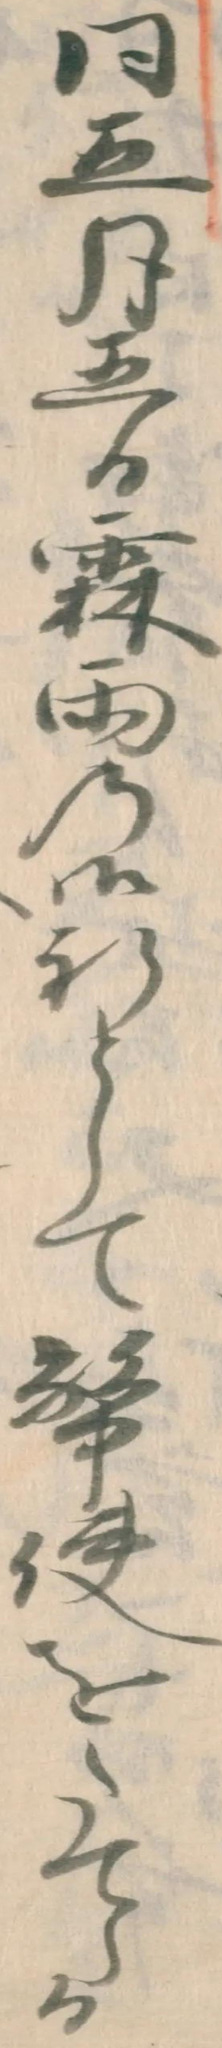同五月五日霖雨の御祈として幣使をたてらる
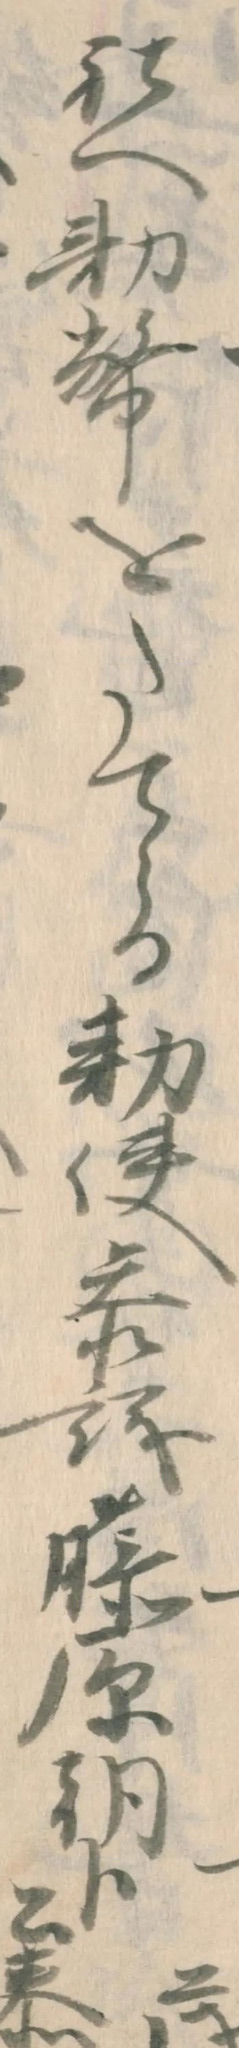社へ勅幣をたてらる勅使参議藤原朝臣公泰
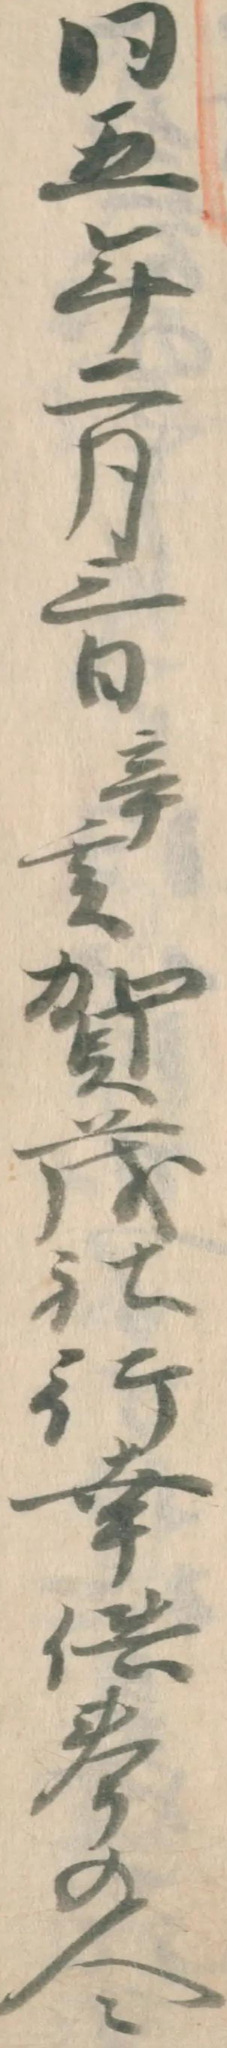同五年二月三日辛亥賀茂社行幸供奉の人々

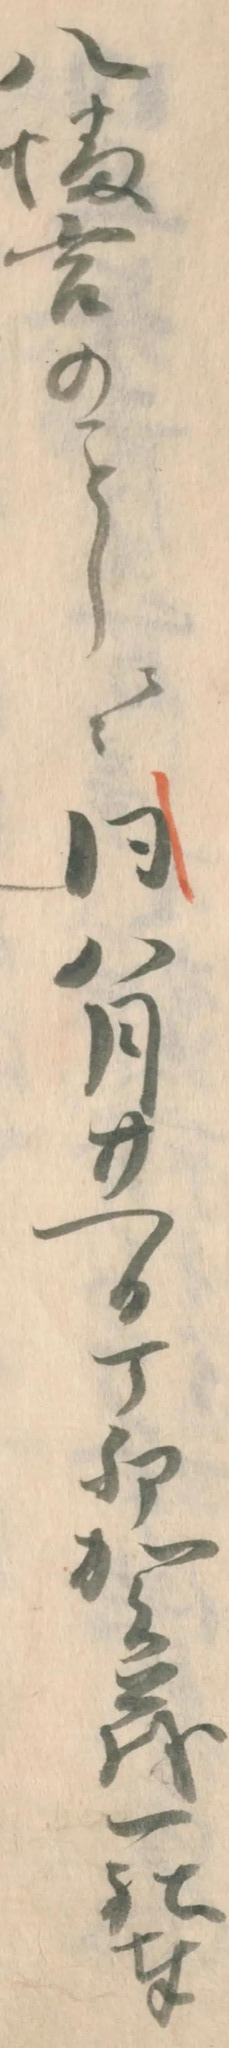八幡宮のことし云々同八月廿一日丁卯賀茂一社奉
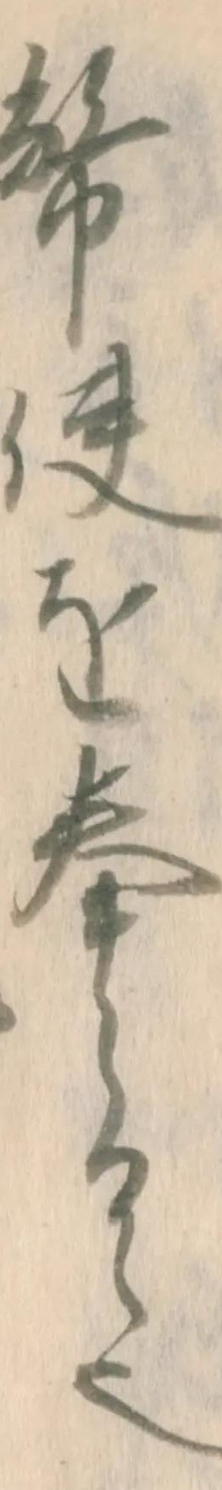幣使を奉らるゝ也
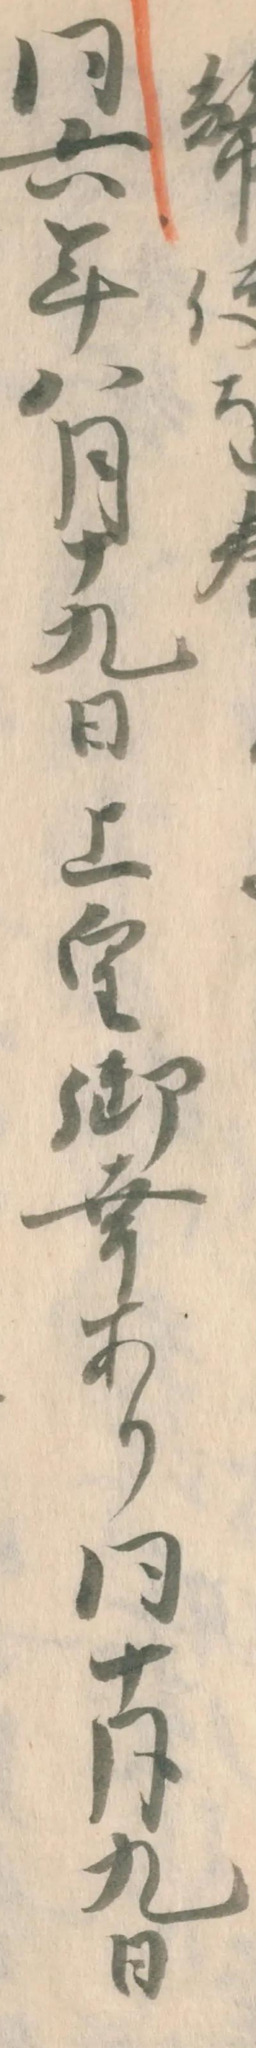同六年八月十九日上皇御幸あり同十月九日
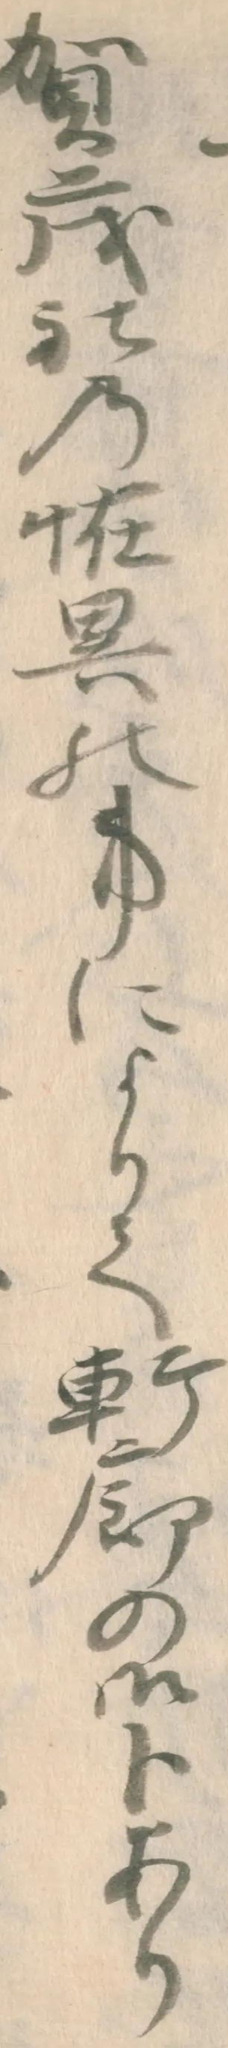賀茂社の恠異の事によりて軒廊の御卜あり
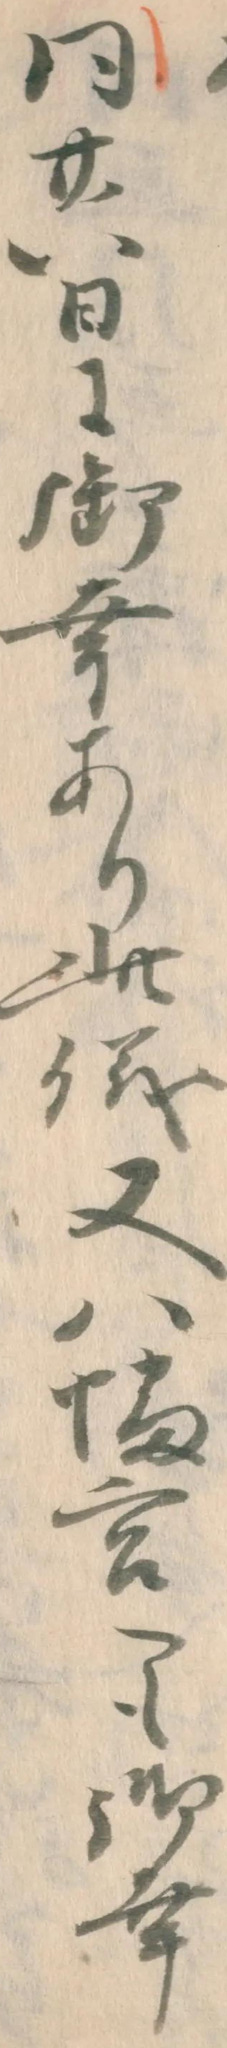同廿八日に御幸あり此儀又八幡宮へも御幸
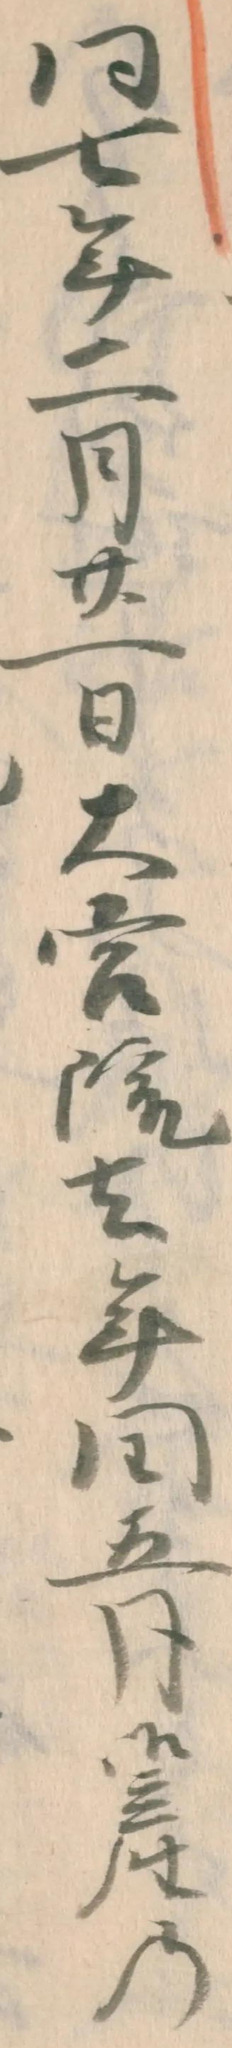同七年二月廿一日大宮院去年閏五月御産の
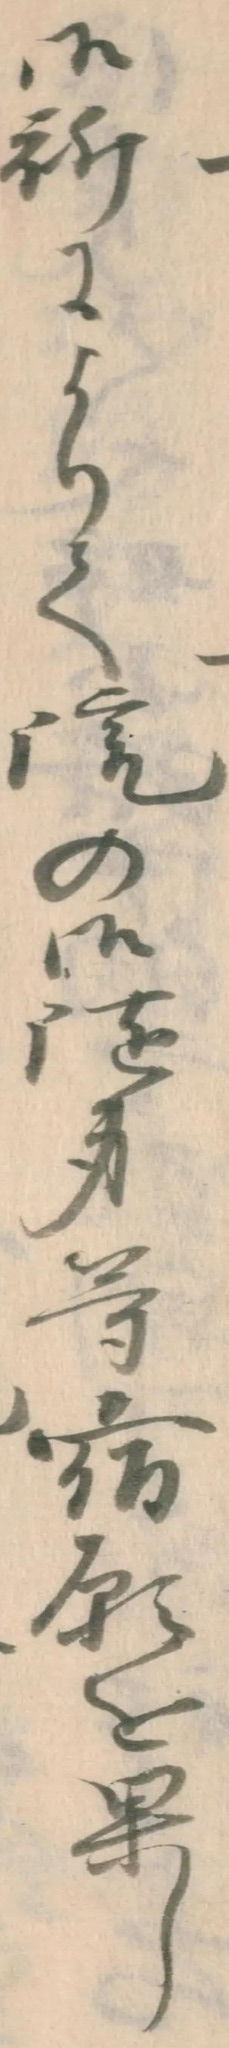御祈によりて院の御随身等宿願を果し
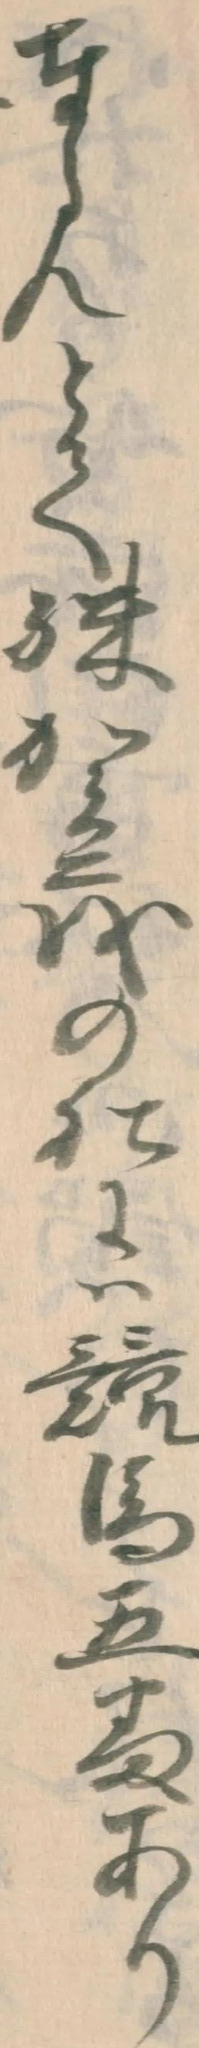奉らんとて殊賀茂の社には競馬五番あり
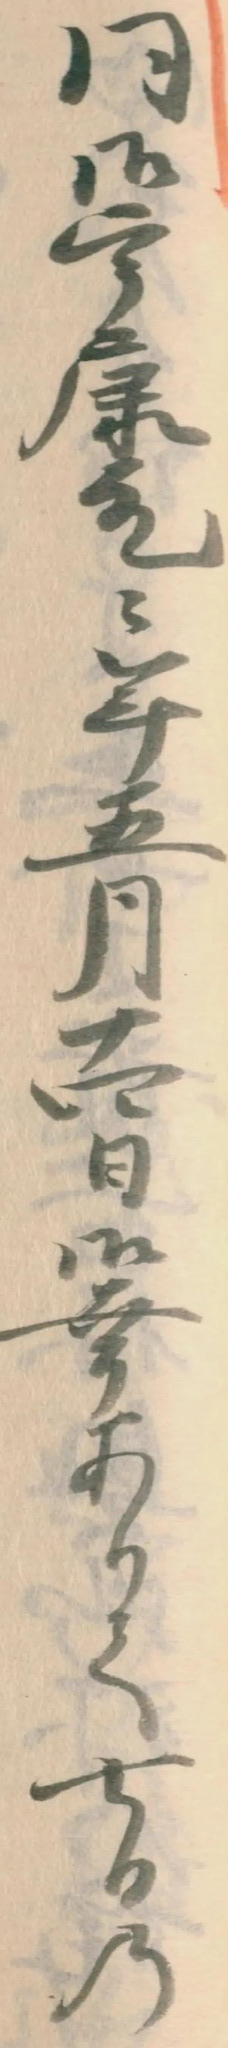同御宇康元々年五月十四日御幸ありて七日の
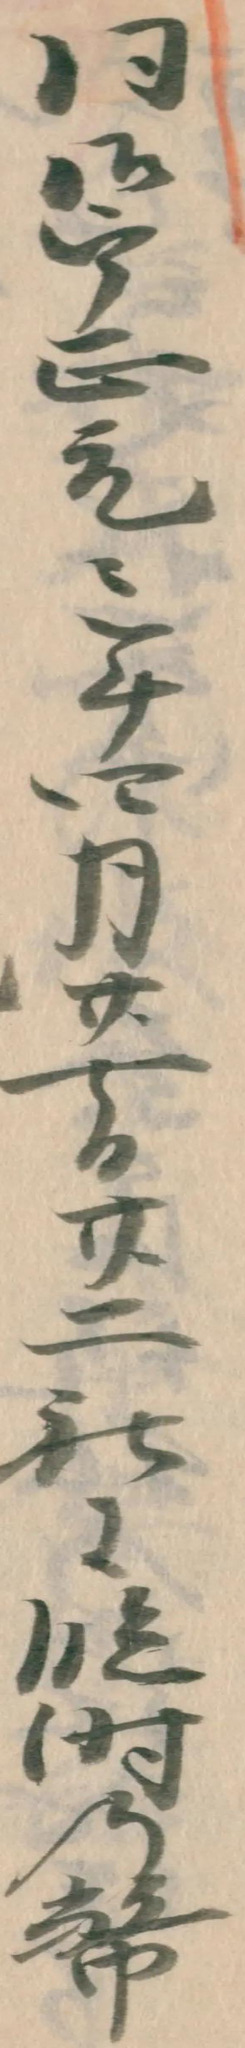同御宇正元々年四月廿七日廿二社に臨時の幣
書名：賀茂社記録. 第1冊
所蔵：国立国会図書館 National Diet Library, JAPAN
